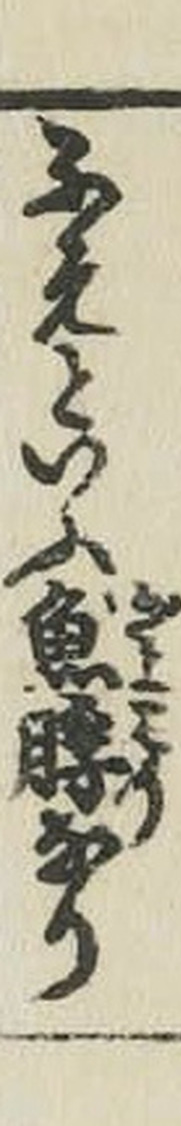ふえといふ魚脬なり
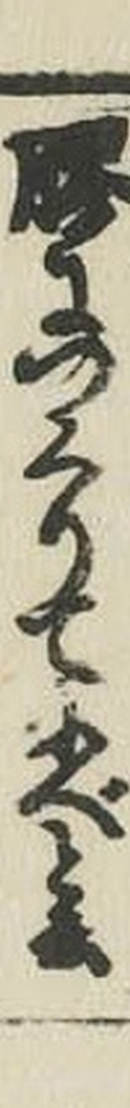膠につくりてにべと云
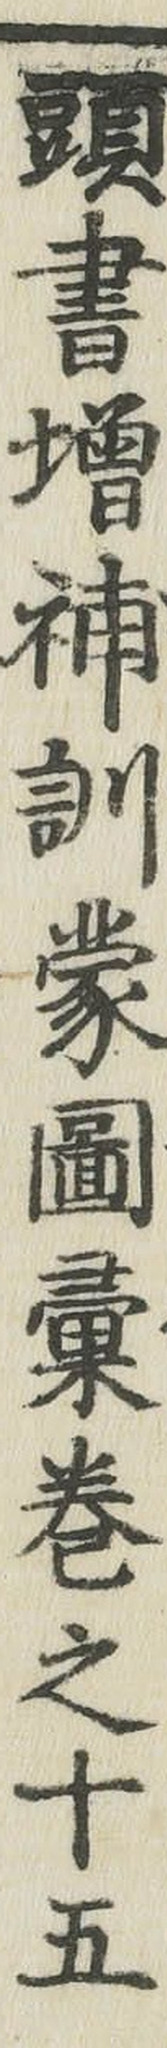頭書増補訓蒙図彙巻之十五
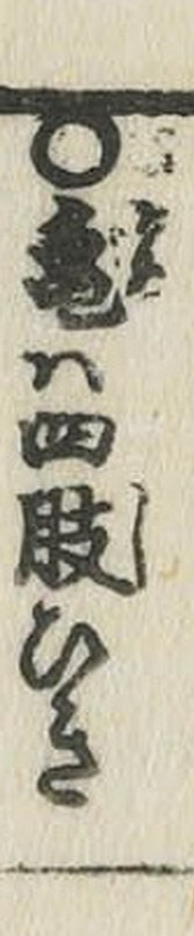○亀は四肢ひき
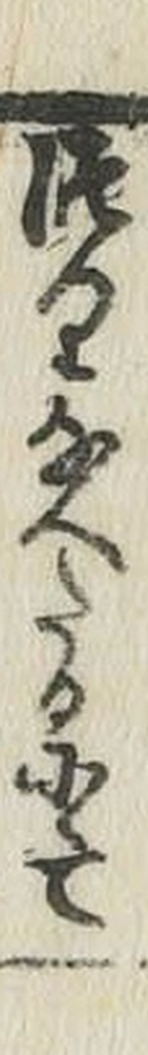つりなへたるにゝて
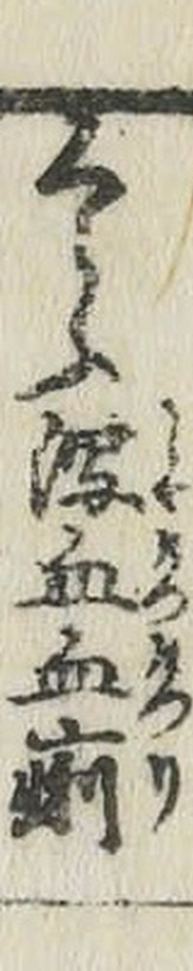くらふ瀉血血痢
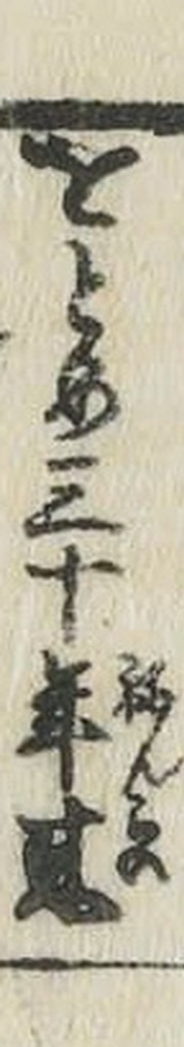をとめ三十年来
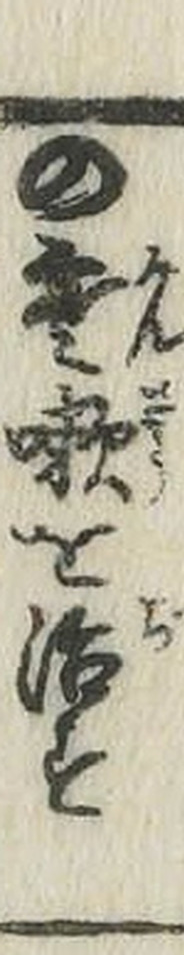の寒嗽を治す
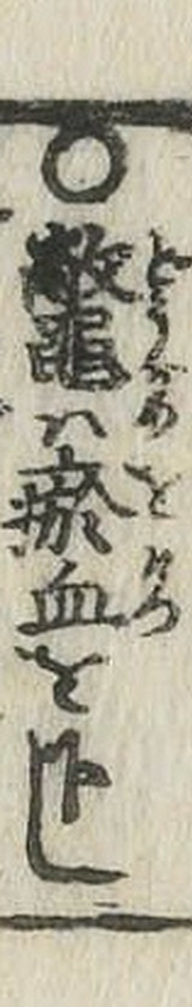○鼈は瘀血を下し
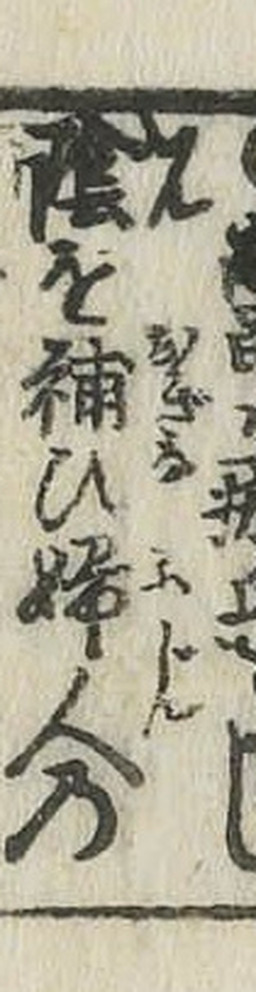陰を補ひ婦人の
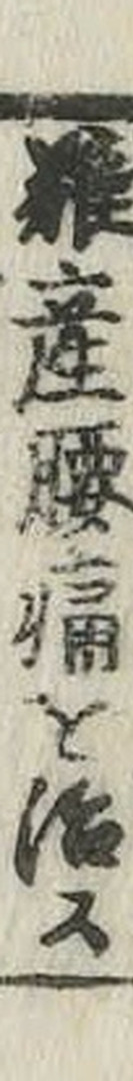難産腰痛を治す
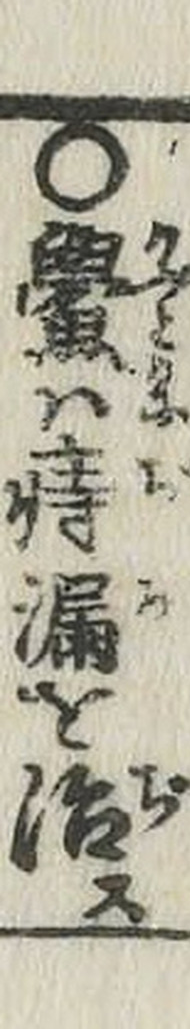○鱟は痔漏を治す
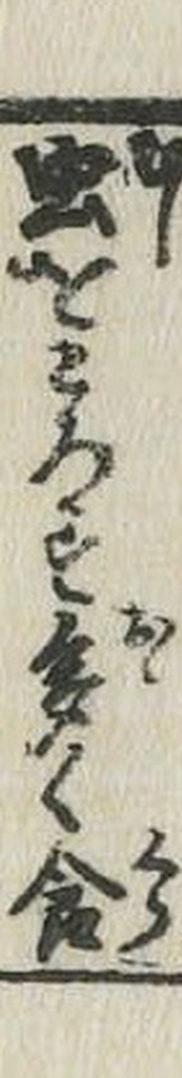虫をころす多く食

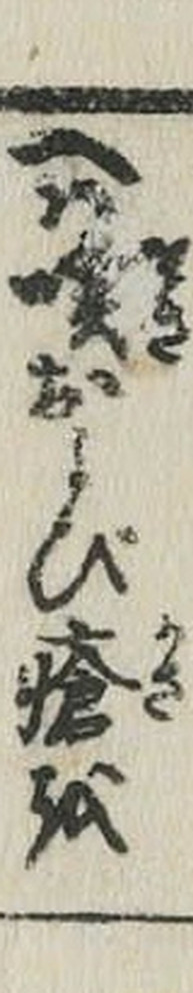へは咳および瘡を
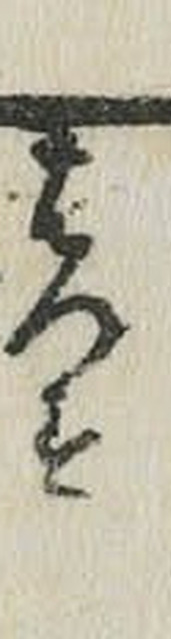はつす
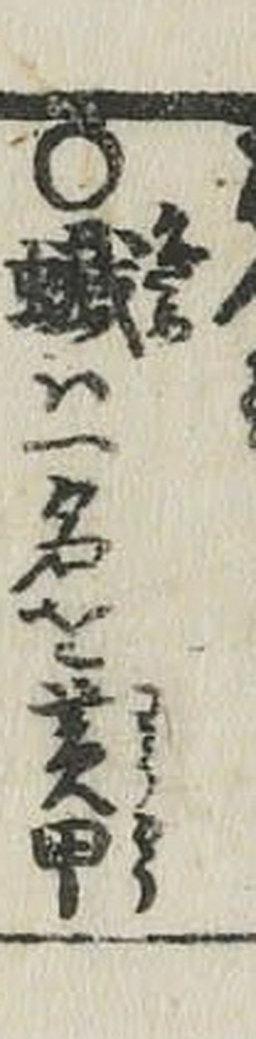○𧔒は一名を黄甲
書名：増補頭書訓蒙図彙大成 10巻 7:巻之14-16
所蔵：東京学芸大学教育コンテンツアーカイブ
